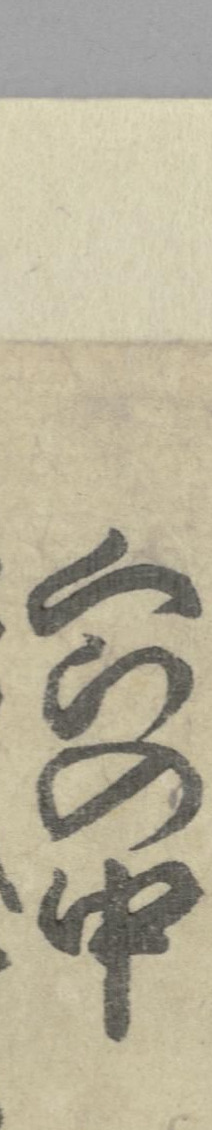くらの中
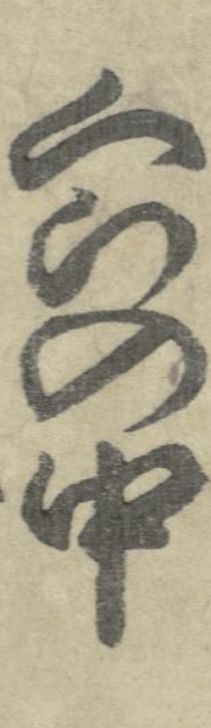くらの中
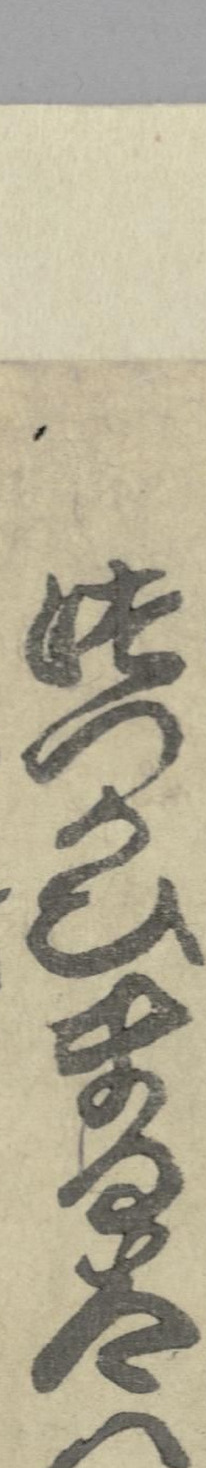つつかひまるたは
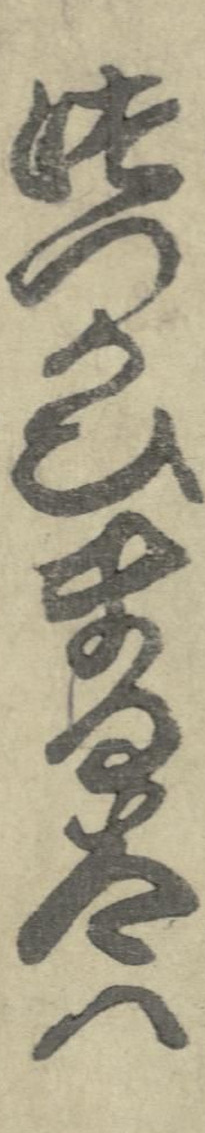つつかひまるたは
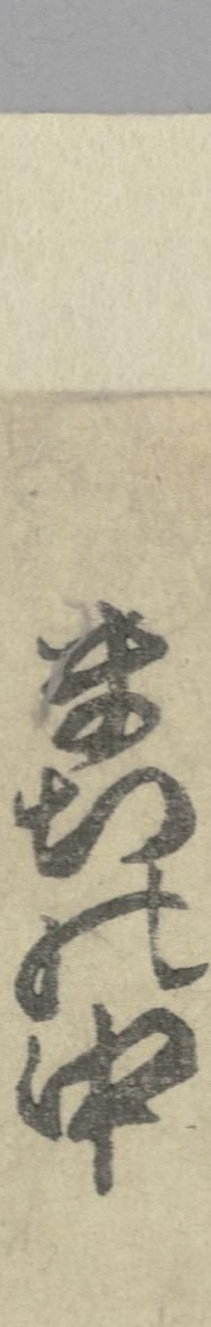まちの中
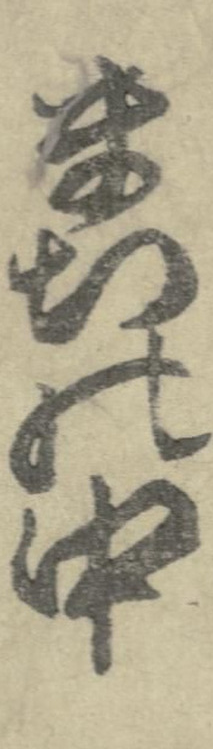まちの中
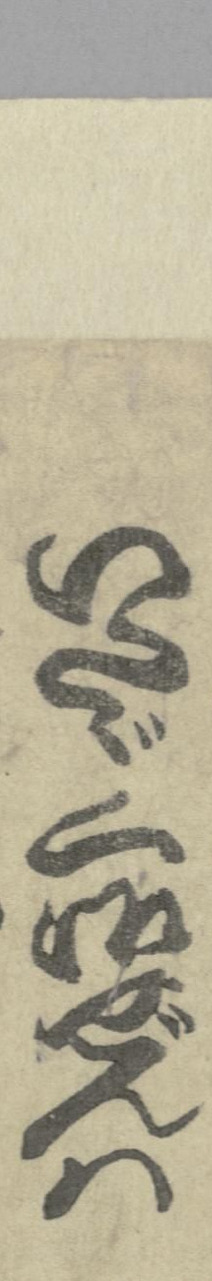いたゞく御ぜんは
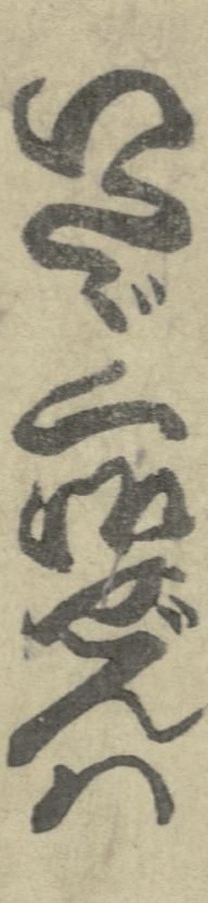いたゞく御ぜんは
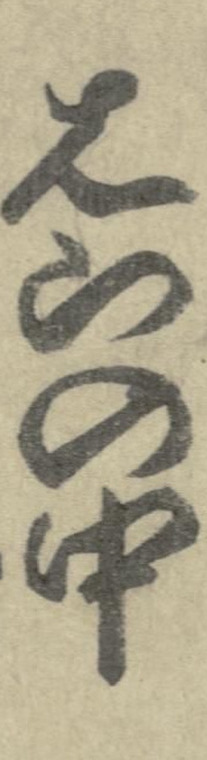はらの中
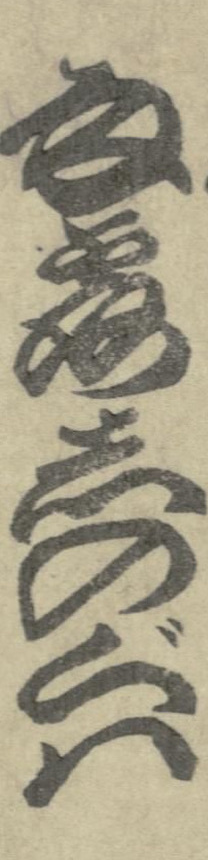雨露しのぐは
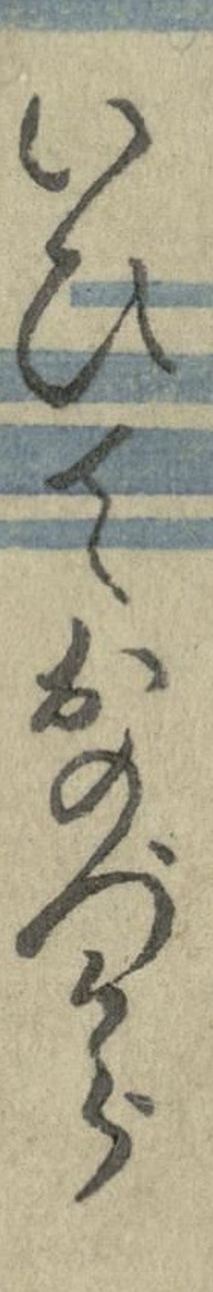いひておのづから
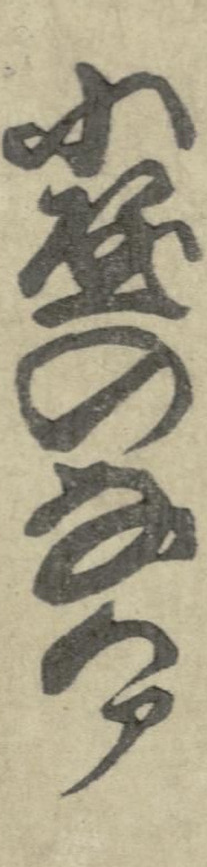小屋のなかア
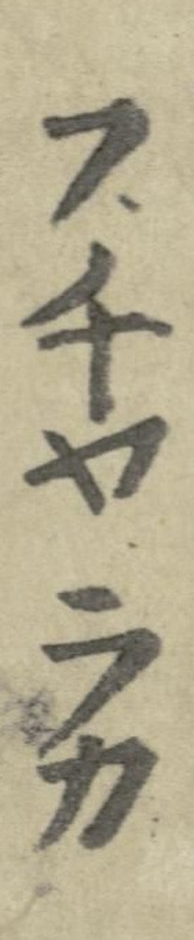スチヤラカ
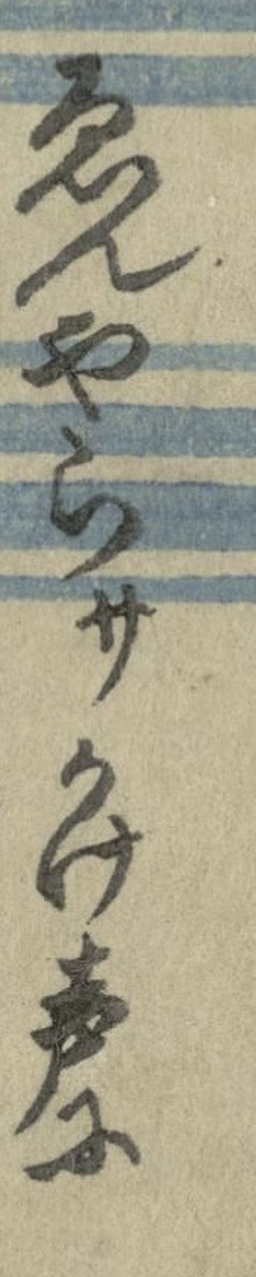ゑんやらサかけ声に
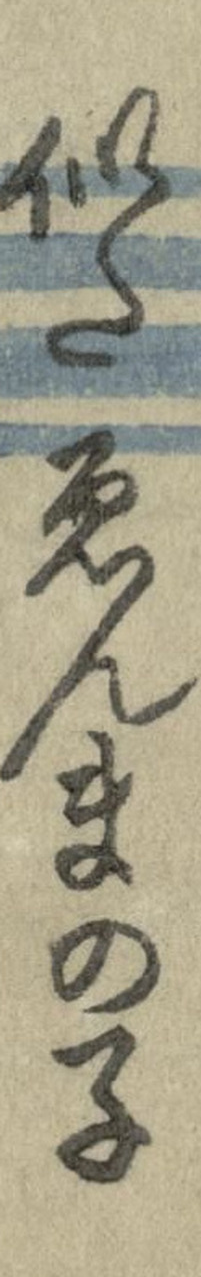似たゑんまの子
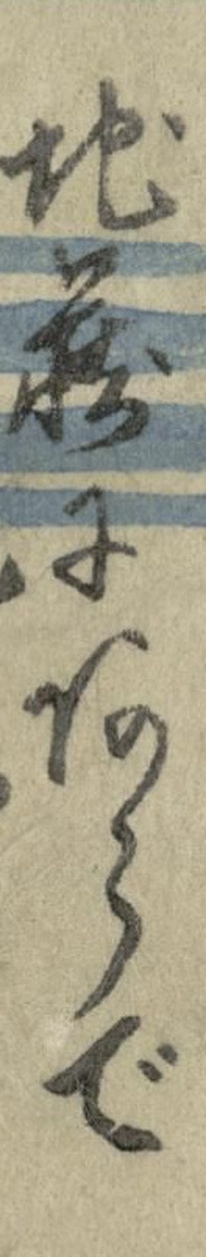地蔵にあらで
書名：ゑんまの子のわけ
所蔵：東京大学地震研究所図書室 Earthquake Research Institute Library, The University of Tokyo, JAPAN
